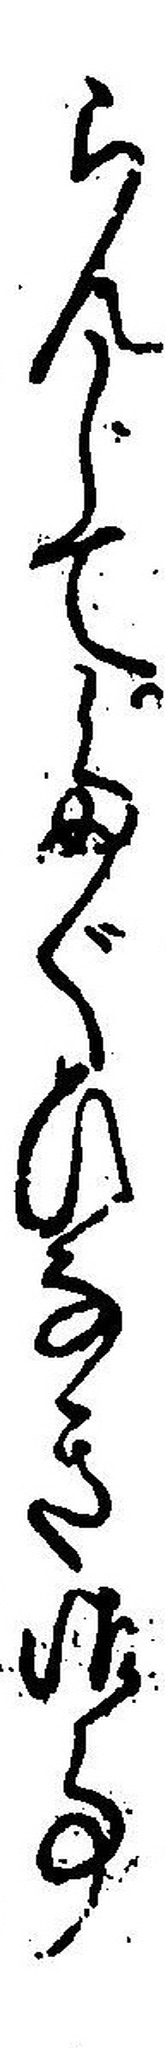らんじて。たぐひなき御事
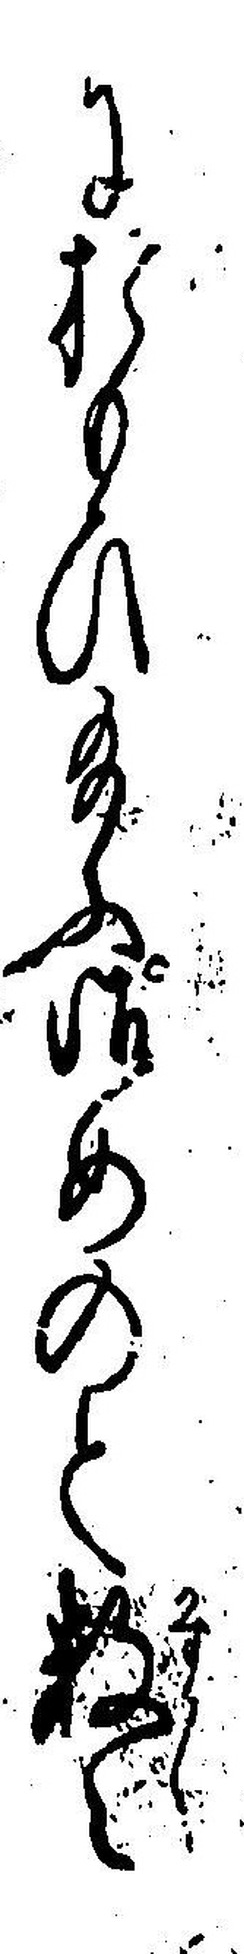におもひ給ふ。御めのと数々
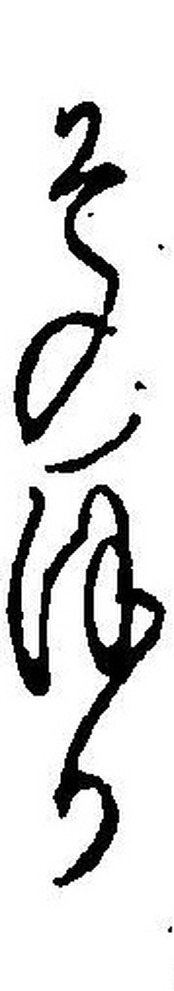そのほか
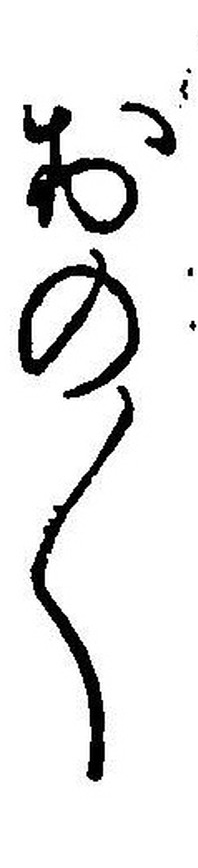おの〳〵
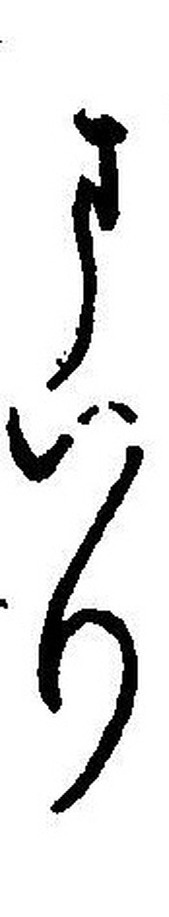まいり
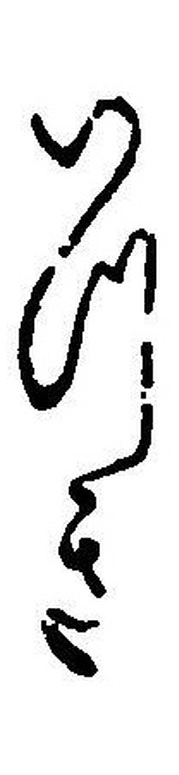いつき
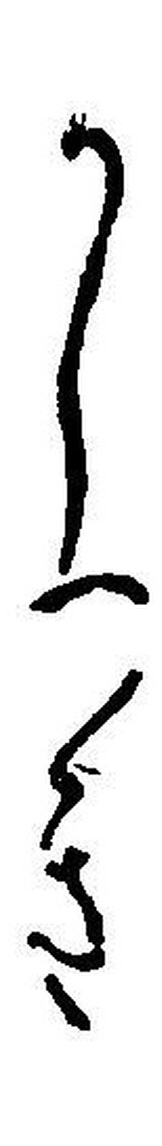かしつき
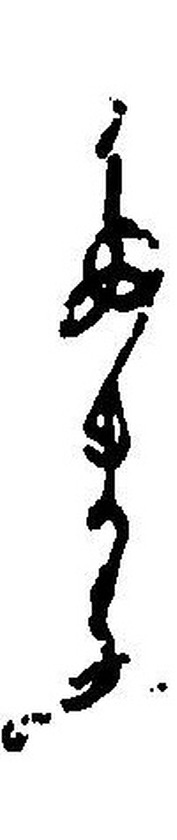たまふ
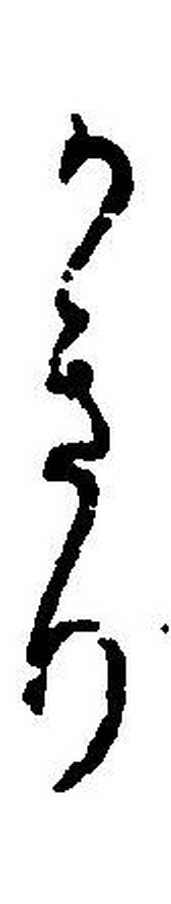かきり
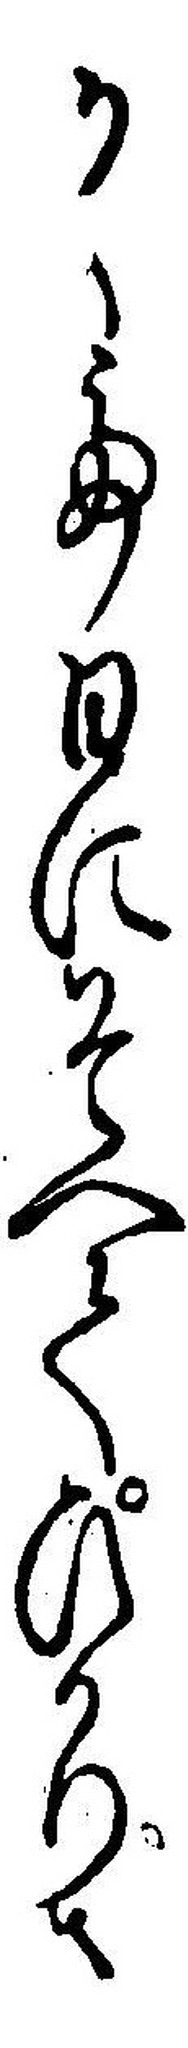かくて日にそへて。ひかりさ
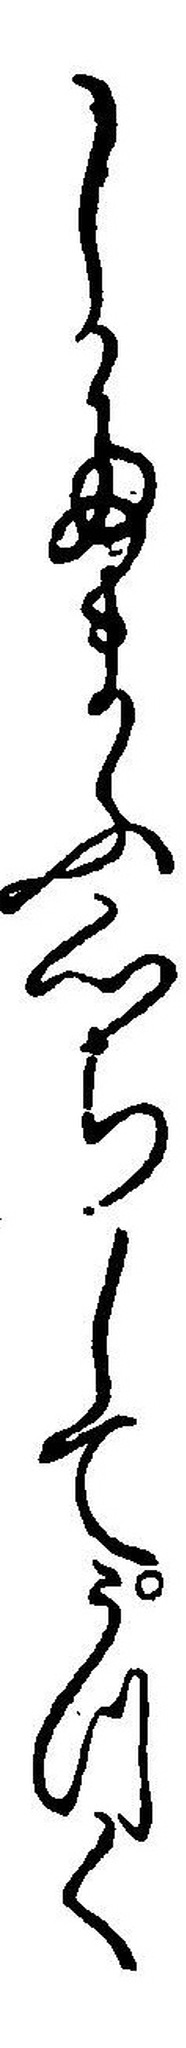したまふ心ちして。うつく
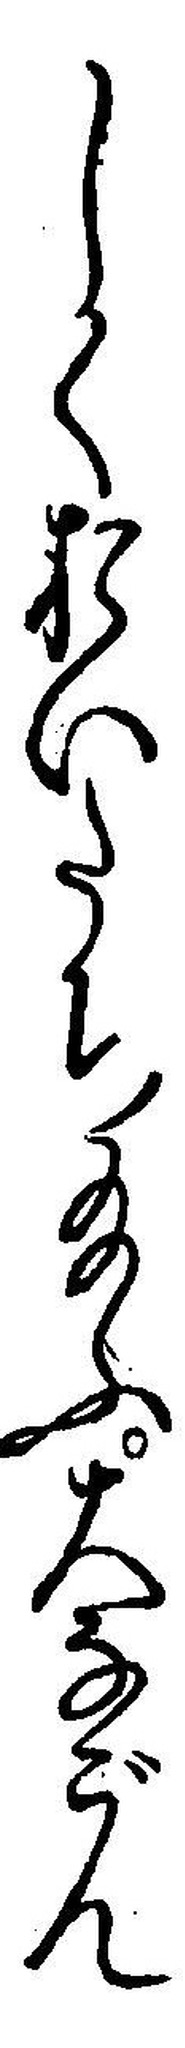しくおいたち給ふ。大なごん
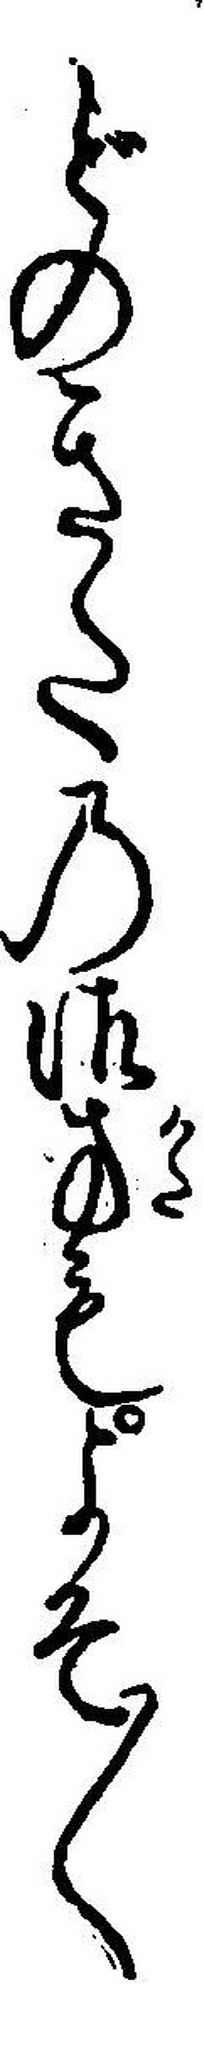どのきたの御方も。よそ〳〵
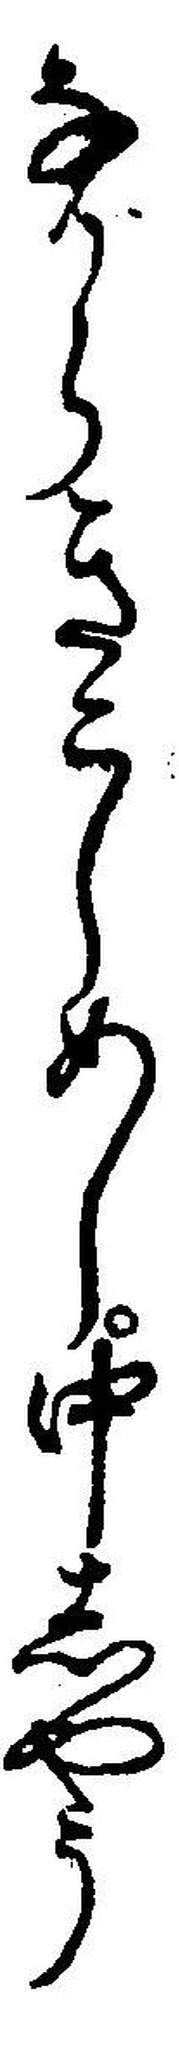ながらきこしめし。中しやう
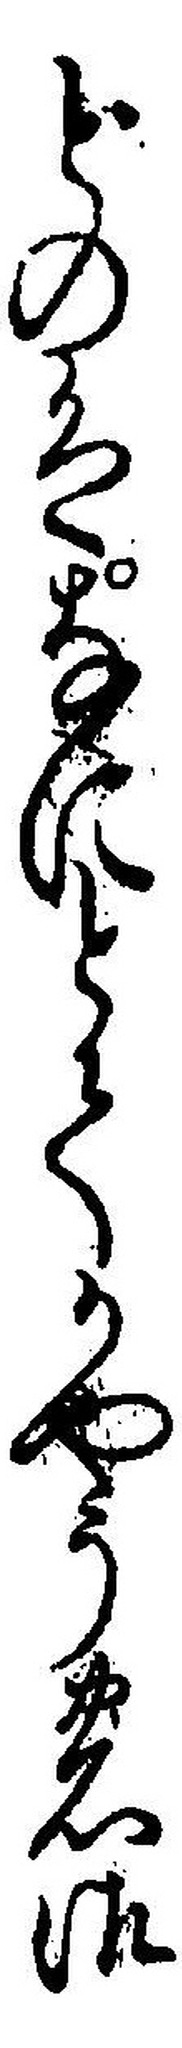どのは。なにとてかやうの御
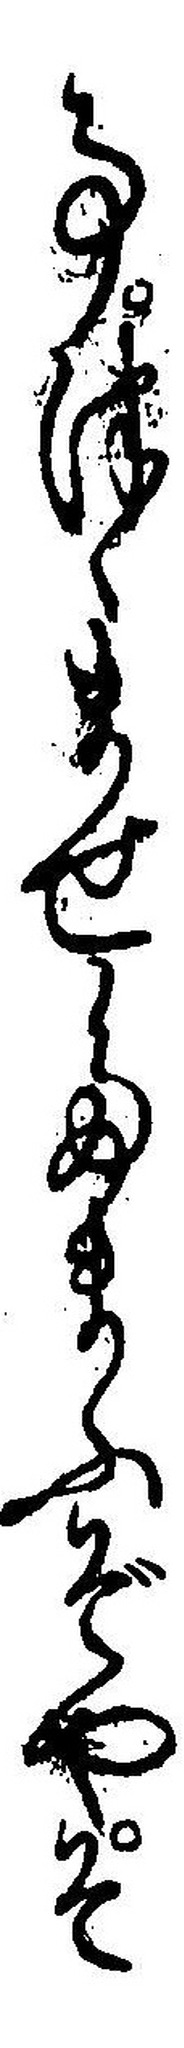事。つゝませたまふぞや。そ
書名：木幡きつね
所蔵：東京大学総合図書館 General Library in the University of Tokyo, JAPAN
